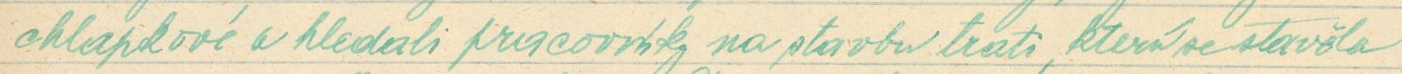chlapkové a hledali pracovníky na stavbu trati, která se stavěla
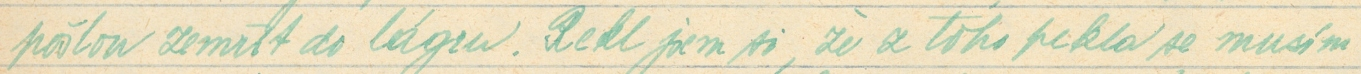pošlou zemřít do lágru. Řekl jsem si, že z toho pekla se musím
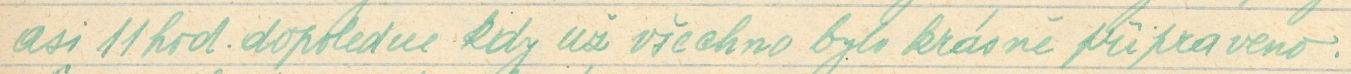asi 11 hod. dopoledne kdy už všechno bylo krásně připraveno.
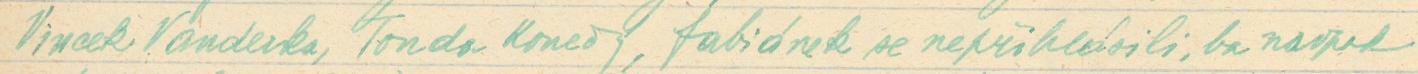Vincek Vanderka, Tonda Konečý, Fabiánek se nepřihlásili, ba naopak
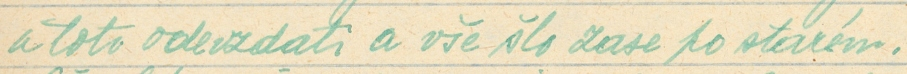a toto odevzdati a vše šlo zase po starém.
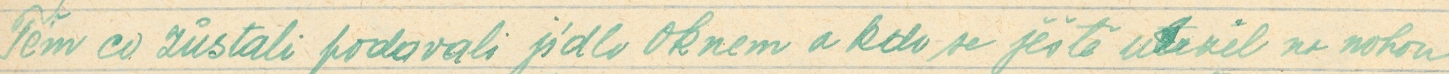Těm co zůstali podavali jídlo oknem a kdo se ještě udržel na nohou
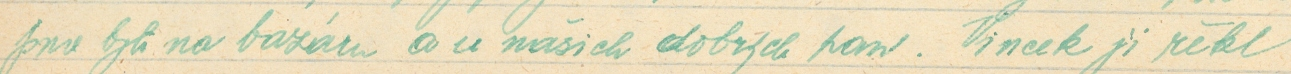jsme byli na bazáru a u našich dobrých paní. Vincek jí řekl
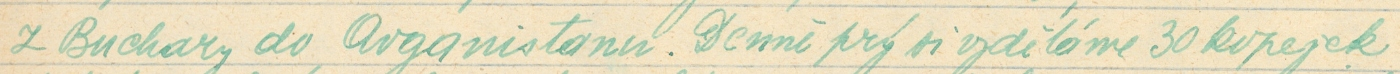z Buchary do Avganistanu. Denně prý si vyděláme 30 kopejek.
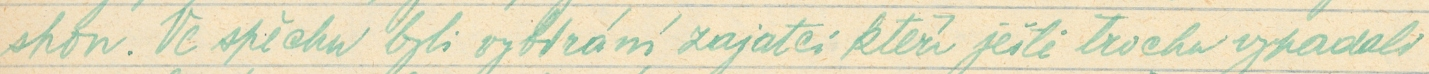shon. Ve spěchu byli vybírání zajatcí kteří ještě trochu vypadali
